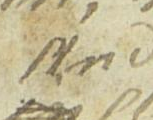and
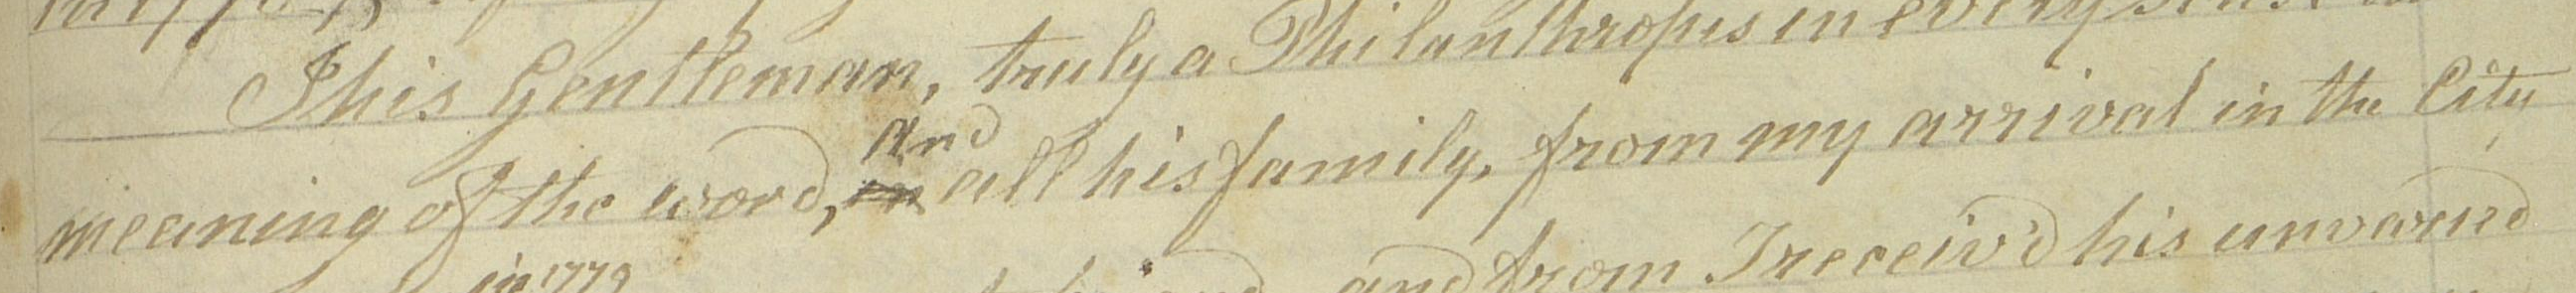meaning of the word, ^ in all his family from my arrival in the City
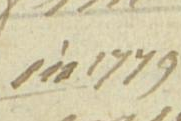in 1779
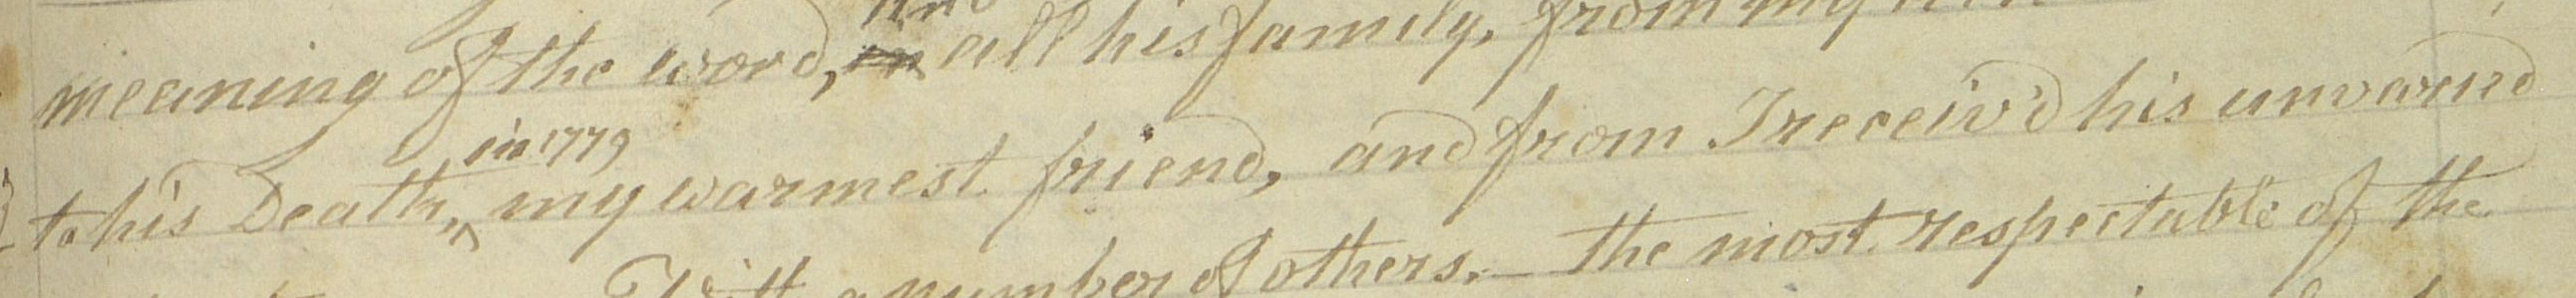to his Death, my warmest friend, and from Preceiv'd his unvaried
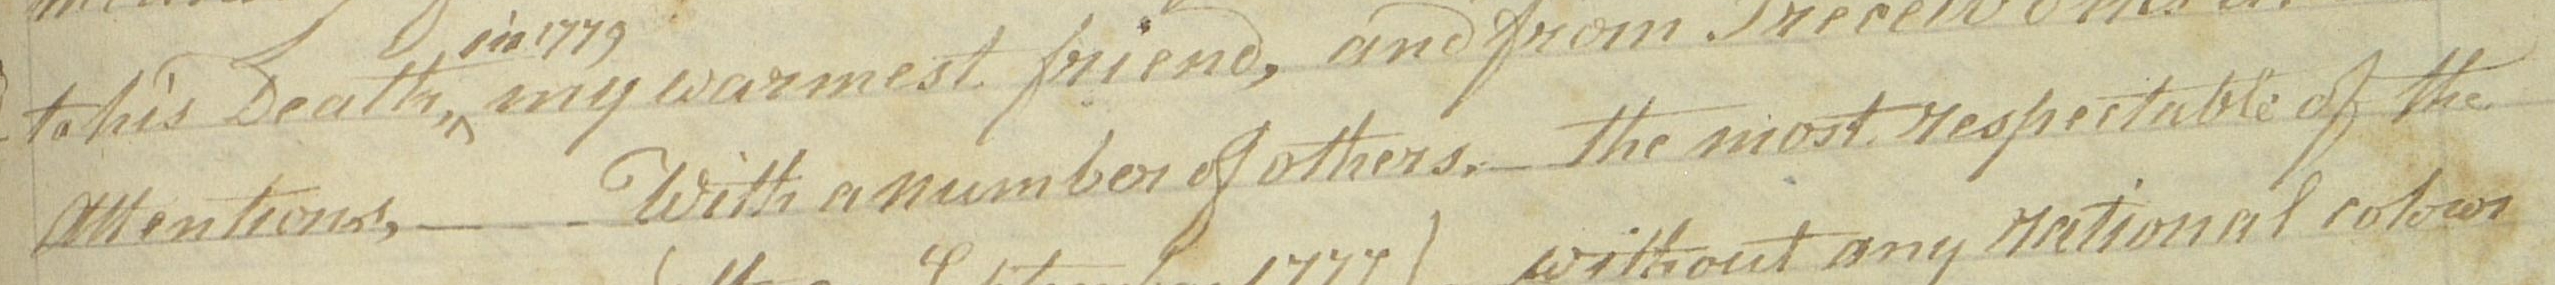Attentions, With a number of others, the most respectable of the
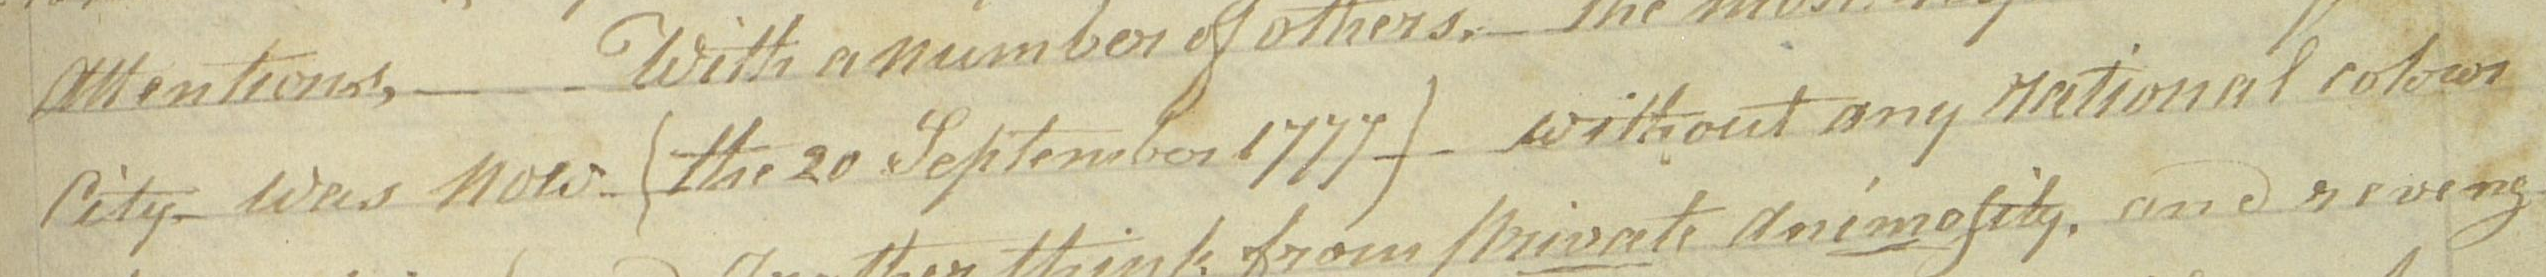City, Was Now (the 20 September 1777) without any rational colour
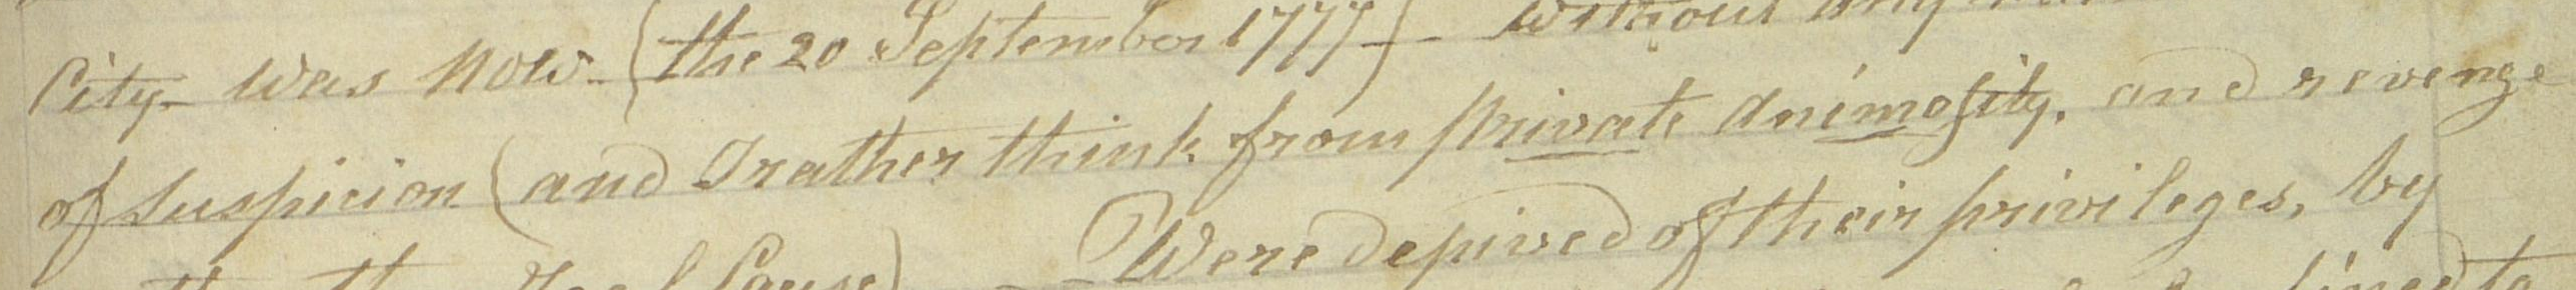of Suspicion (and I rather think from private animosity, and revenge
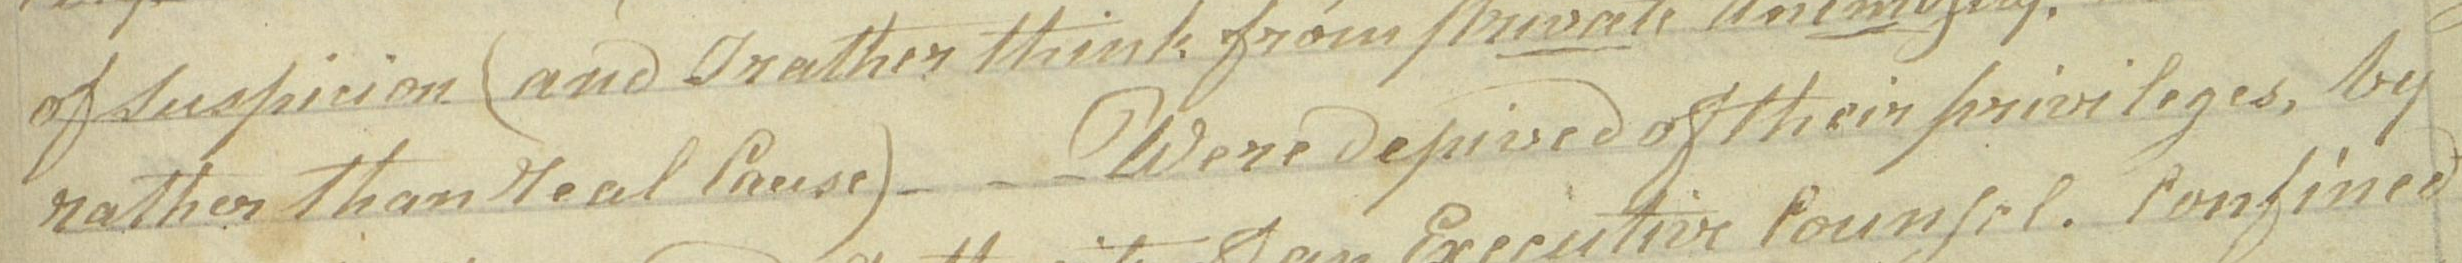rather than real Cause) Were depived of their privileges, by
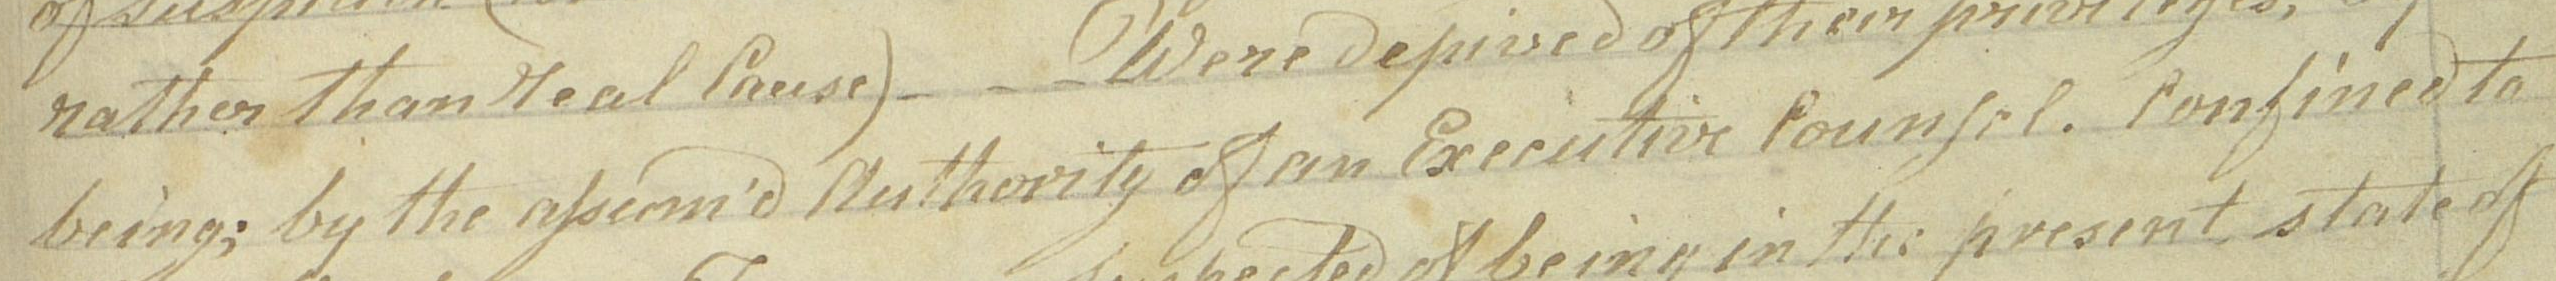being; by the assum'd Authority of an Executive Counsel. confined to
